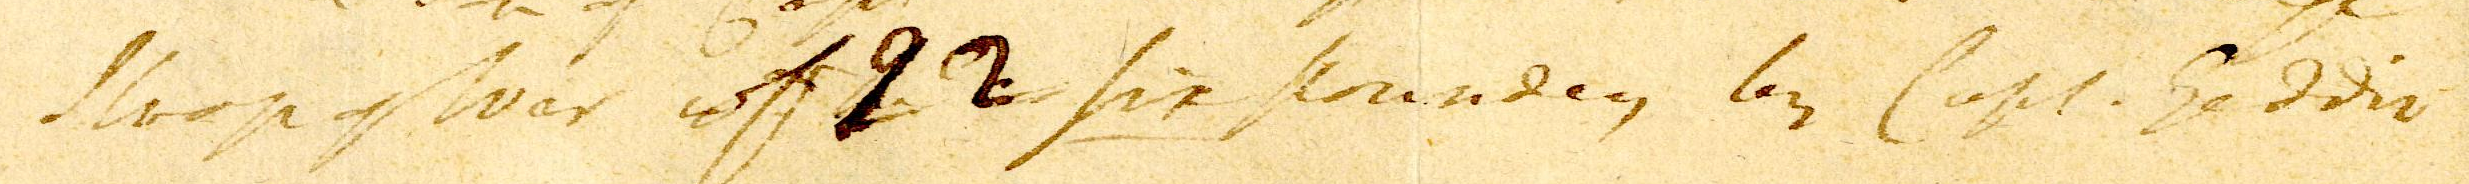Sloop of Ever w^th 92 six poundes by Capt. Geddis
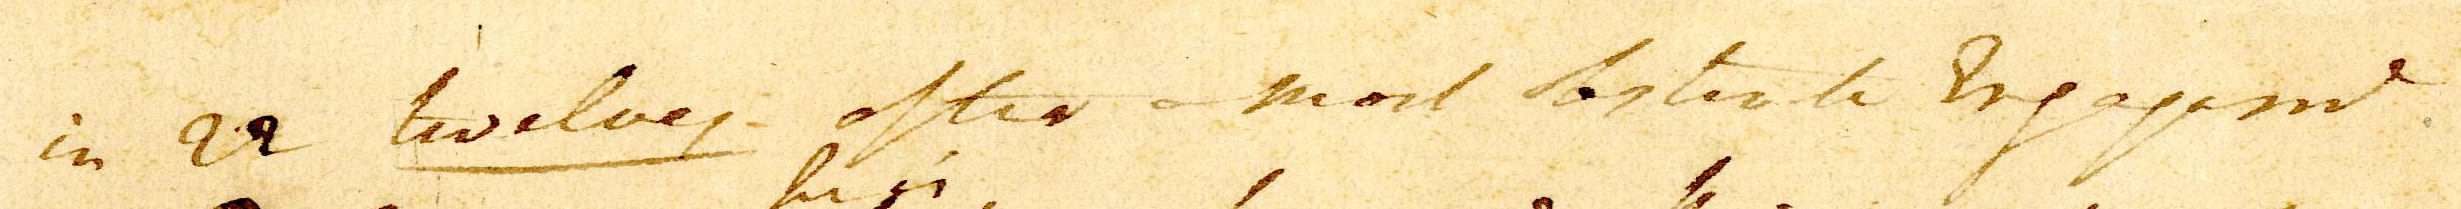in 22 twelves often- mort Estate Engagem^t.
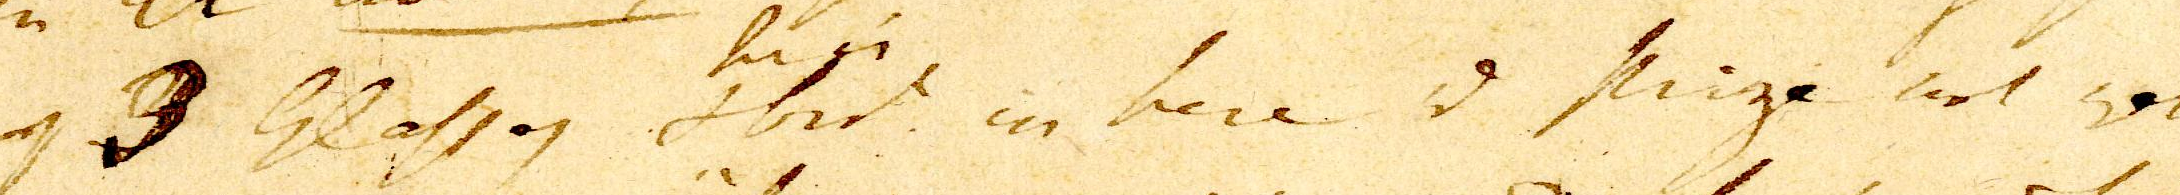3 Glasses ^ but in here y^e prize not yet
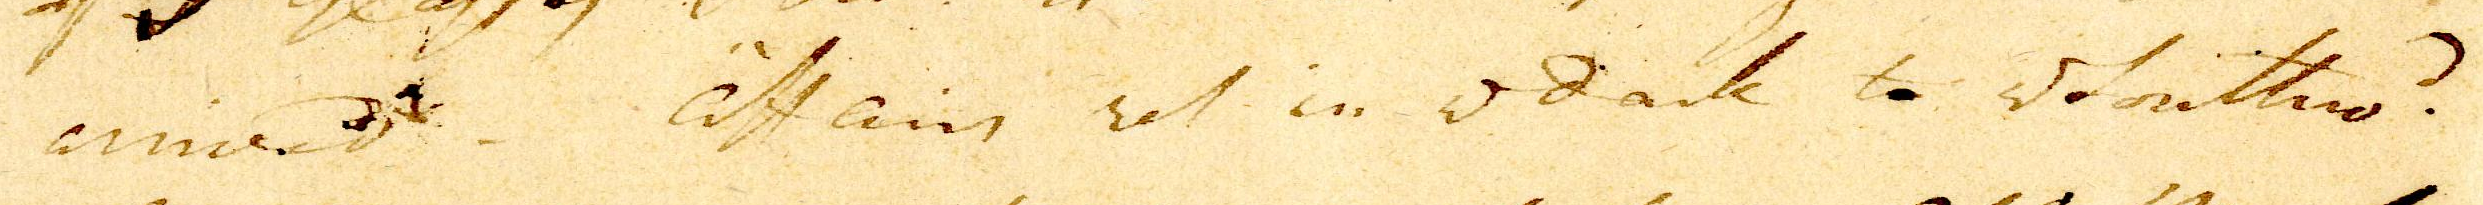arrived. affairs yet in y^e dark to y^e Southra^d
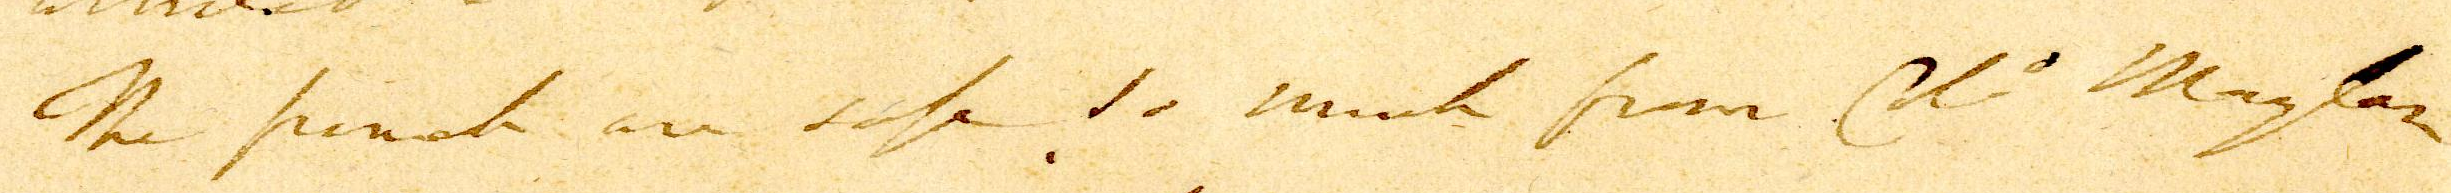The French are safe so much from Col^o Maylor
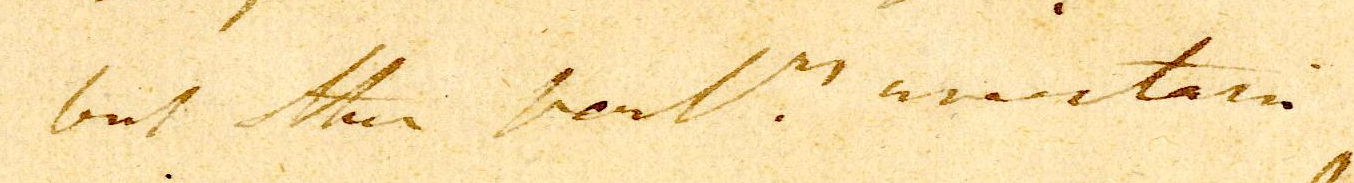but other part^rs uncertain
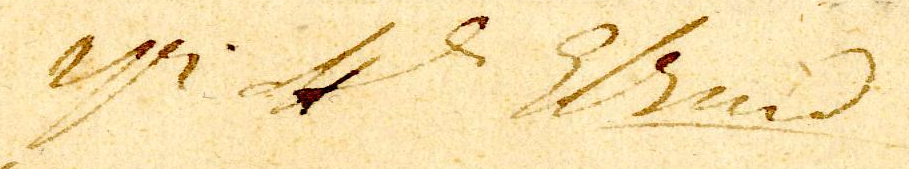Y^r aff^t EBurd
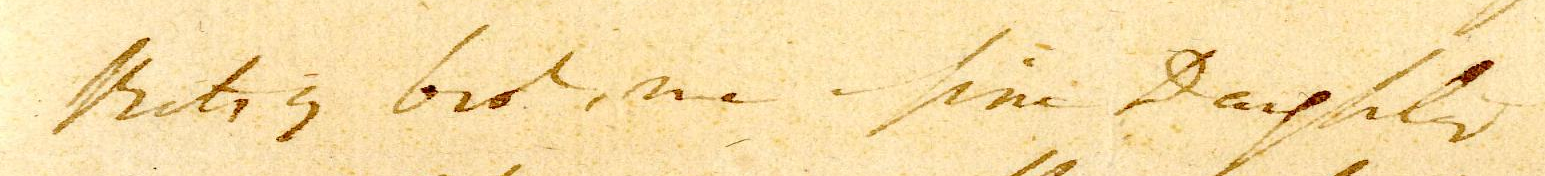Betsy wrot me- fine daughter
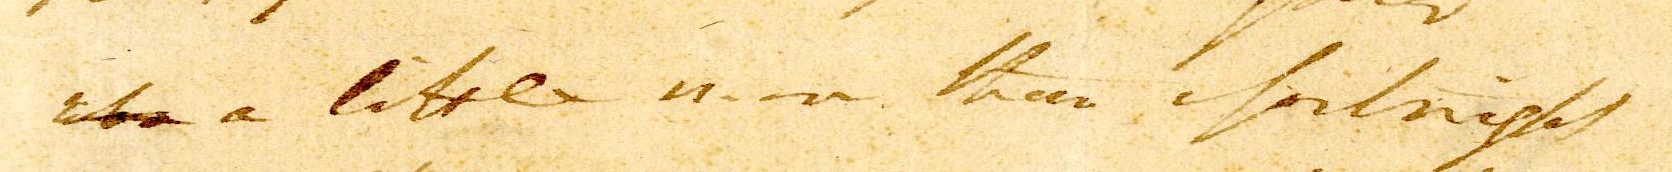ibn a little more than sprilness
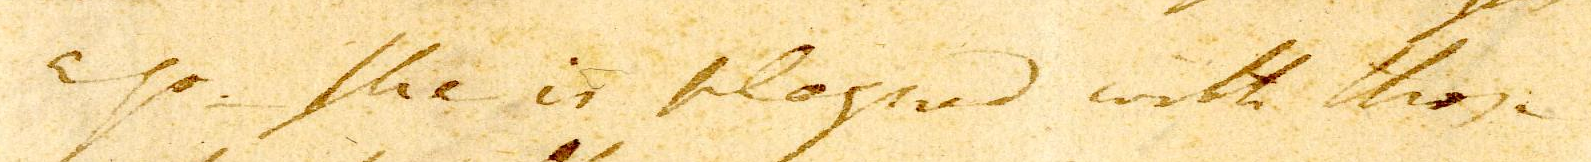ago. she is pleased with these
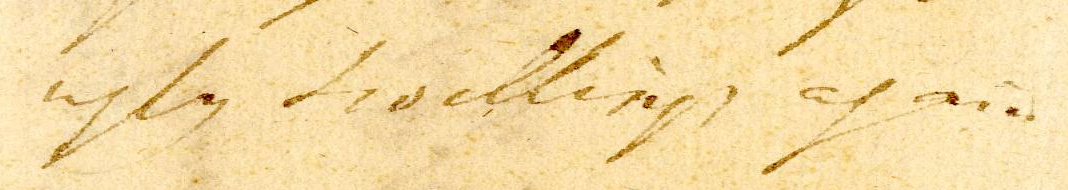ugly dwellings again
